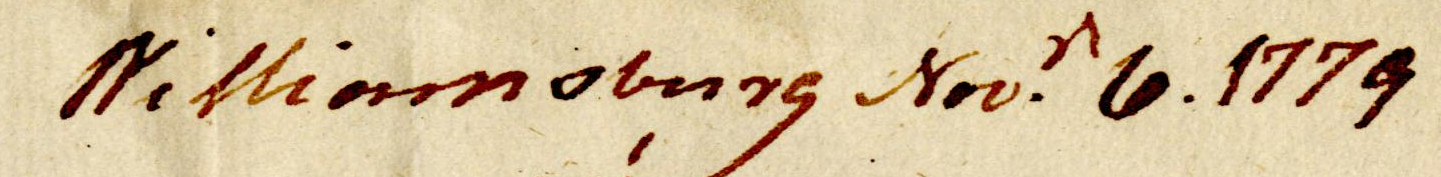Williamsburrg Nov^r. 6. 1779
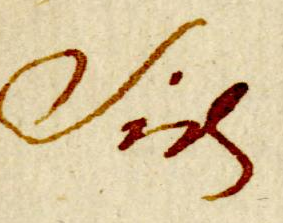Sir
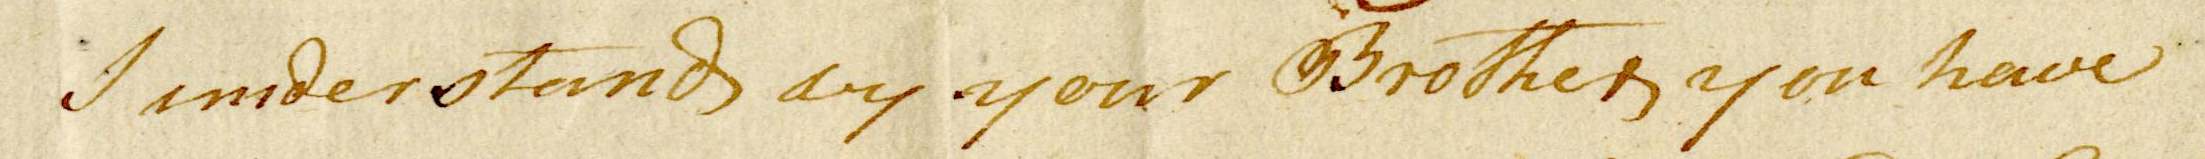I understand by your Brother, you have
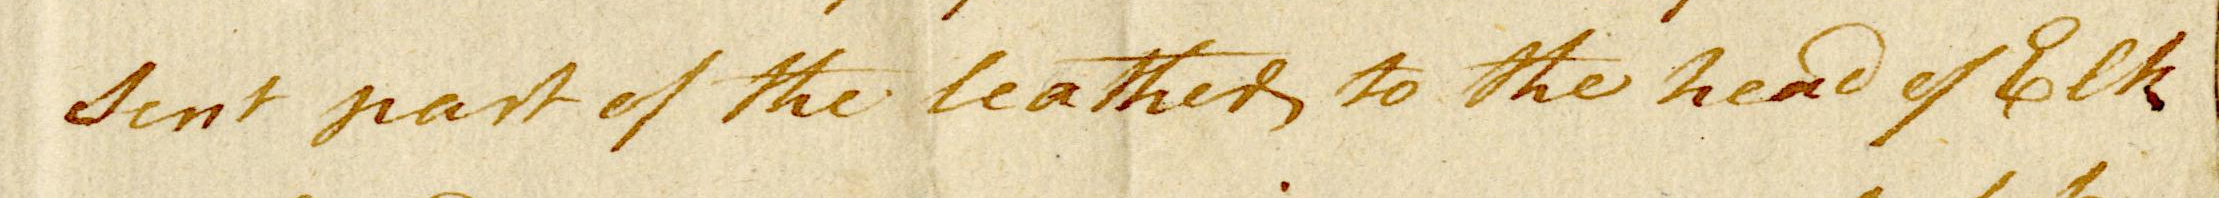sent part of the leather to the head of Elk.
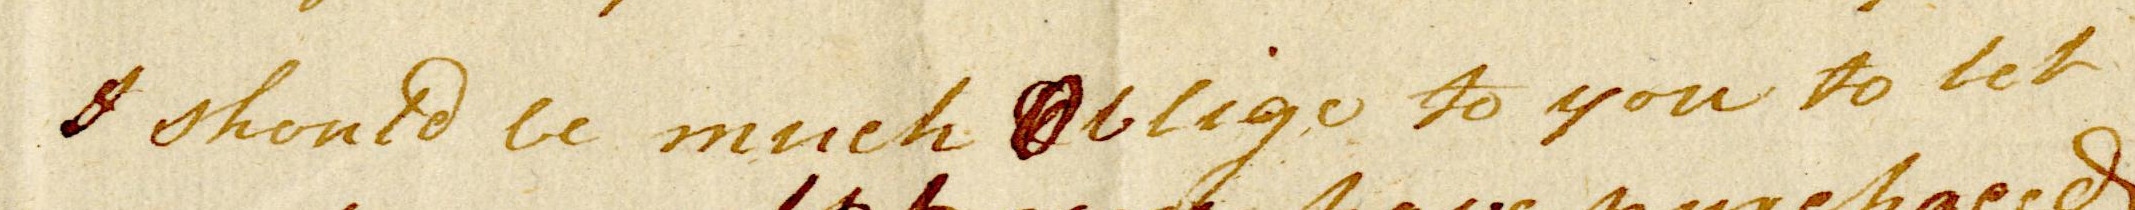I should be much oblige to you to let
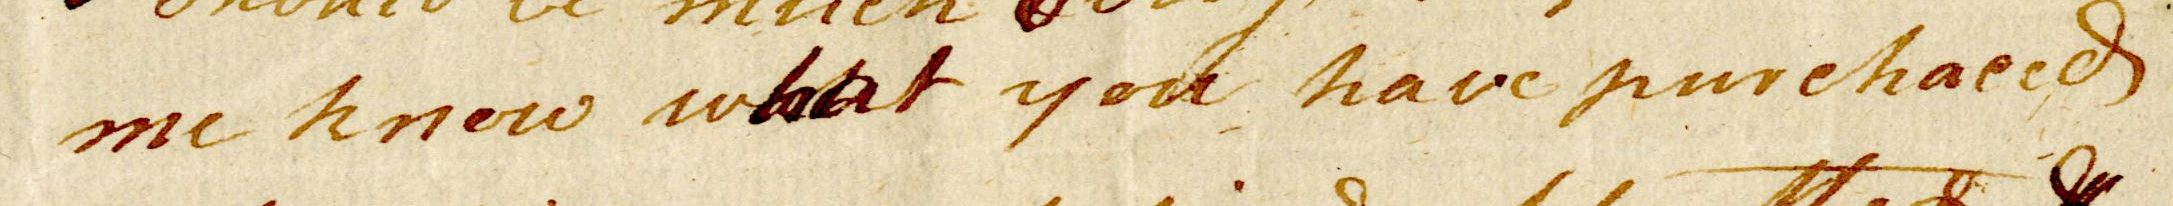me know what you have purchased
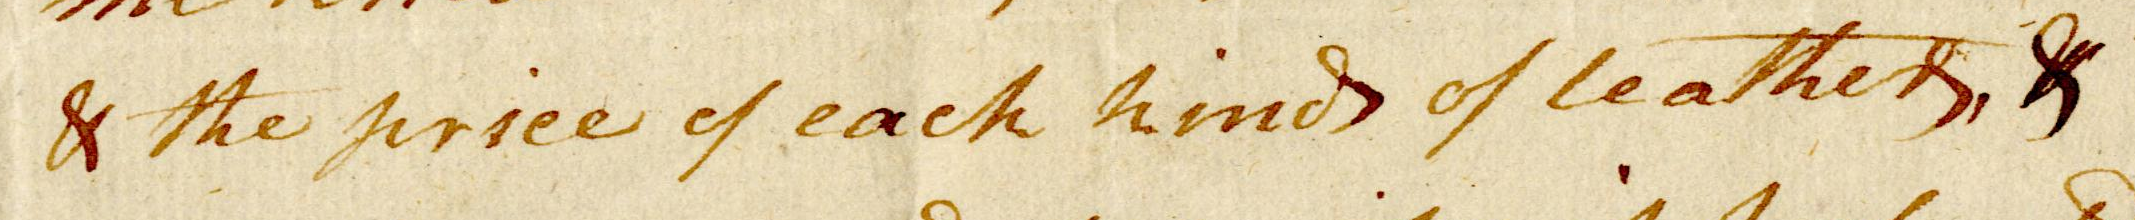& the price of each kinds of leathers, &
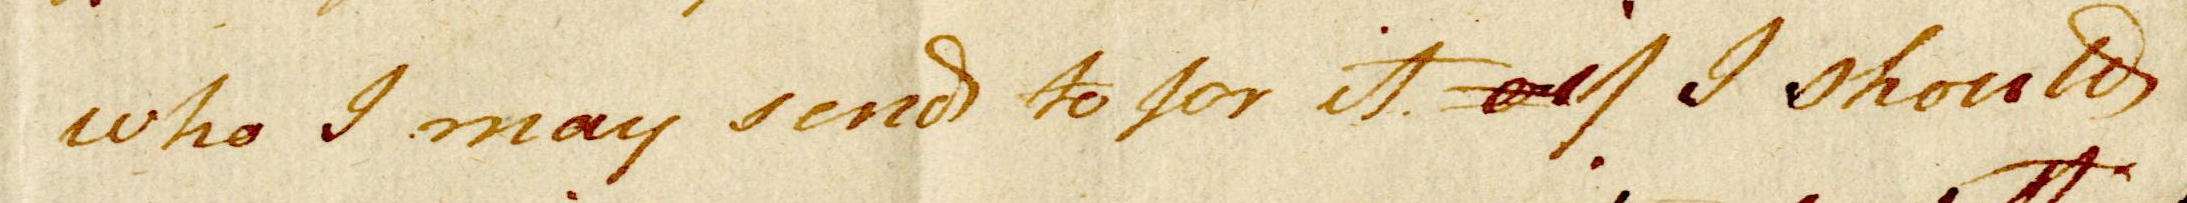who I may send to for it [_] if I should
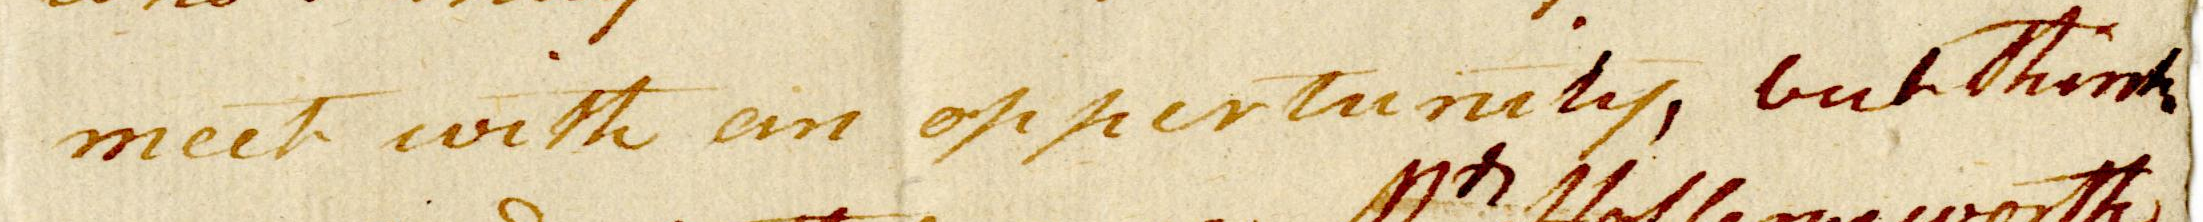meet with an oppertunity, but think
